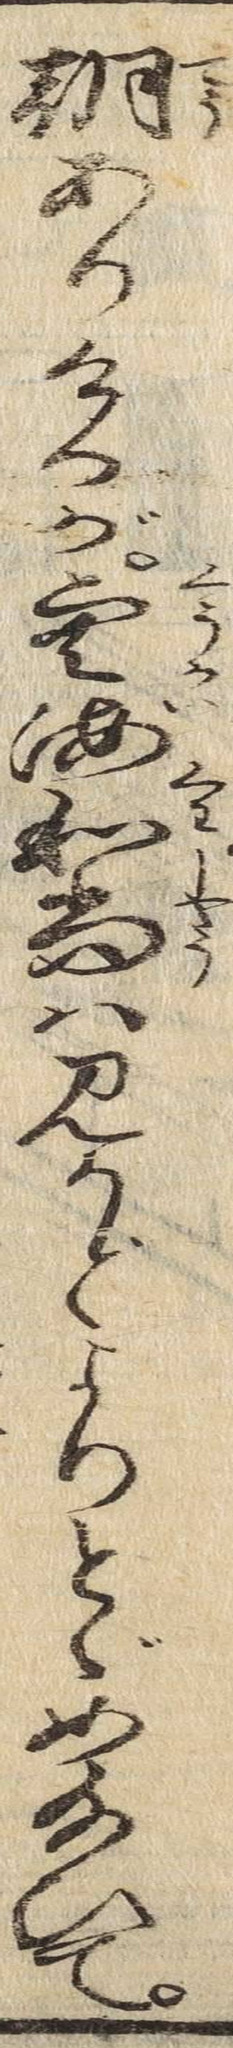朝ありけるか。空海和尚はみかどよりとゞめ給ひて。
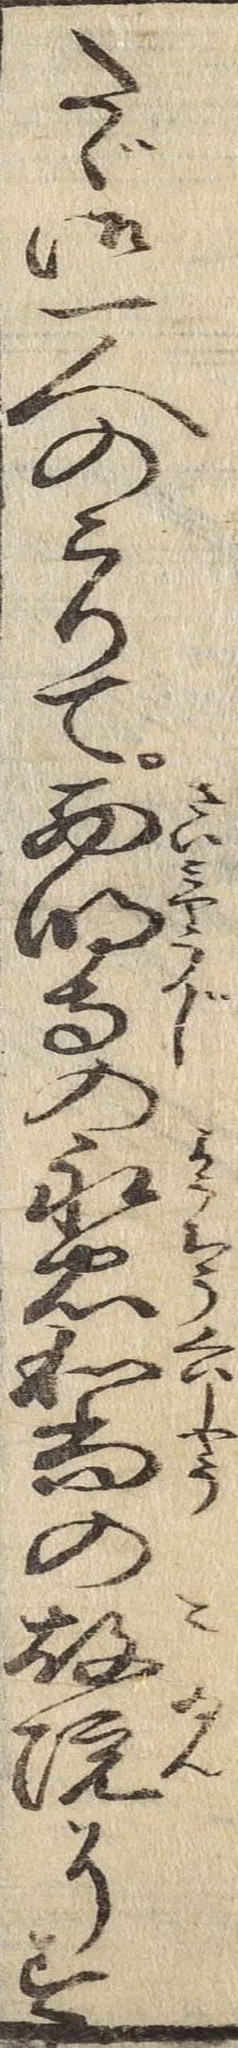たゞ一人のこりて。西明寺の永忠和尚の故院にす
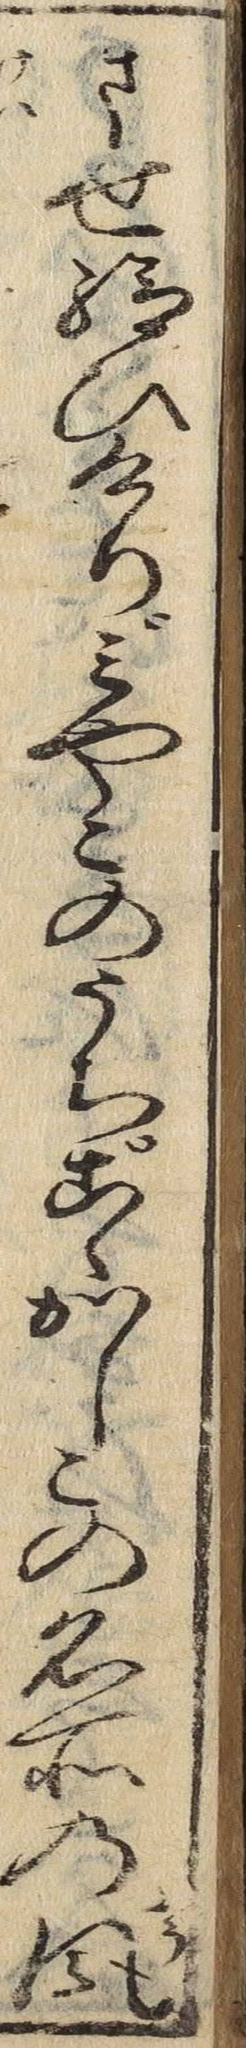ませたまひけり。みやこのうち。こゝかしこの目鵜書の風
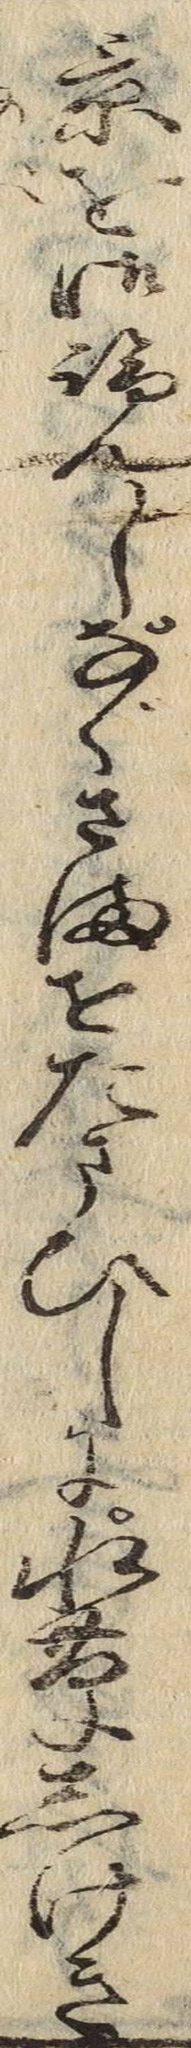景を御覧し。なぐさまをたまひしに。水草しけき
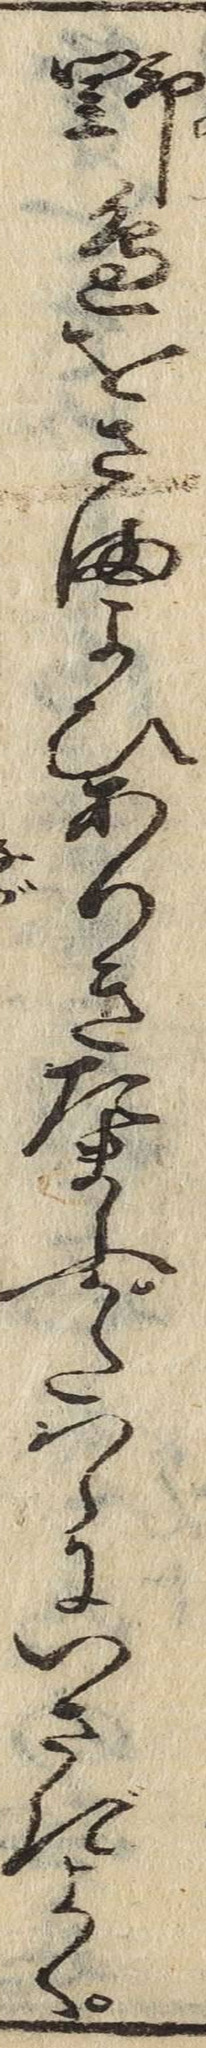野辺をさまよひありきたまふ。かたはらにいさきよく。
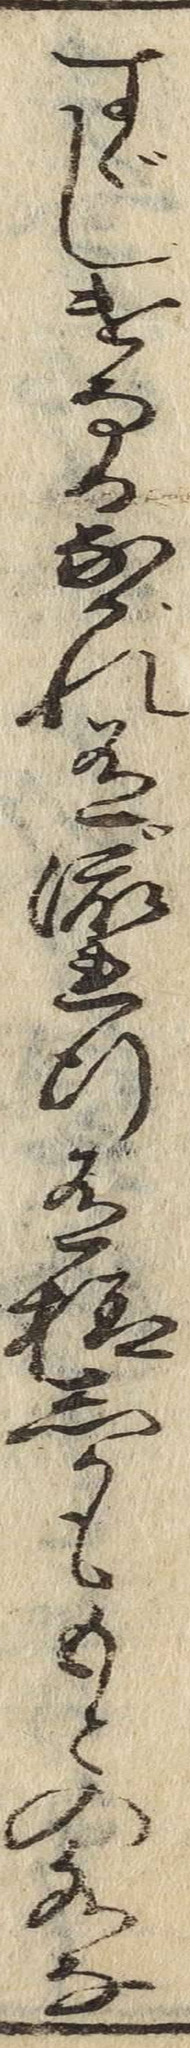すゞしけるかながれ有。流れ行有様しかももとの水な
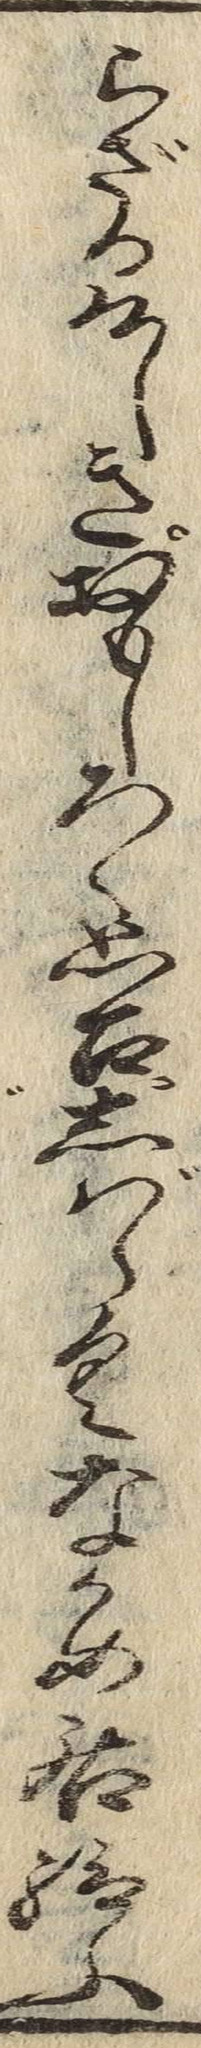らざるけしき。おもしろく思召。しはらくなかめ居給ふ
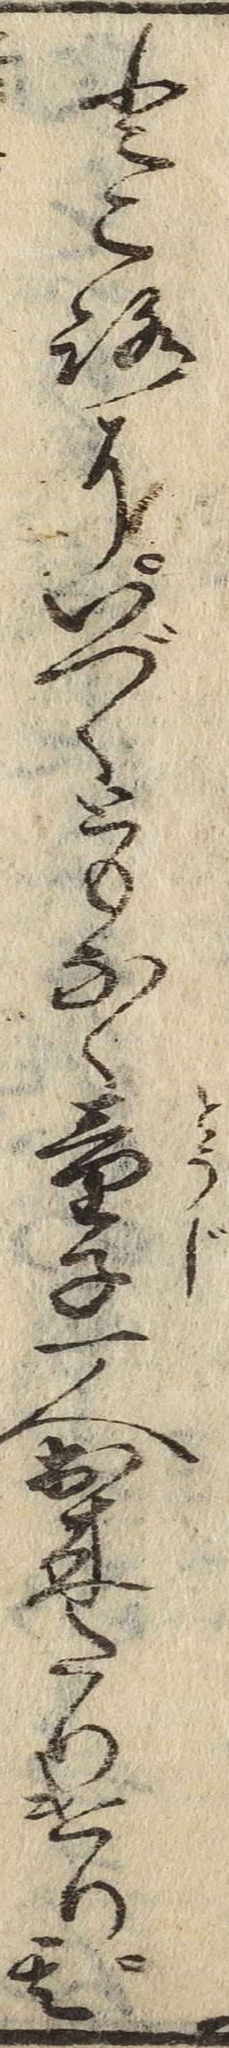ところに。いづくともなく童子一人出来たりけり。其
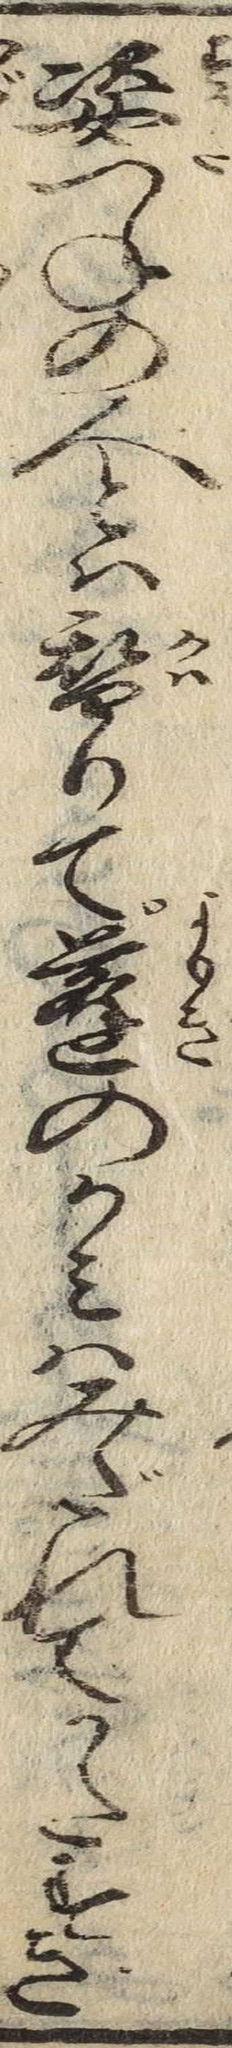姿つねの人とは替りて蓬のかみはみだれてかたすき
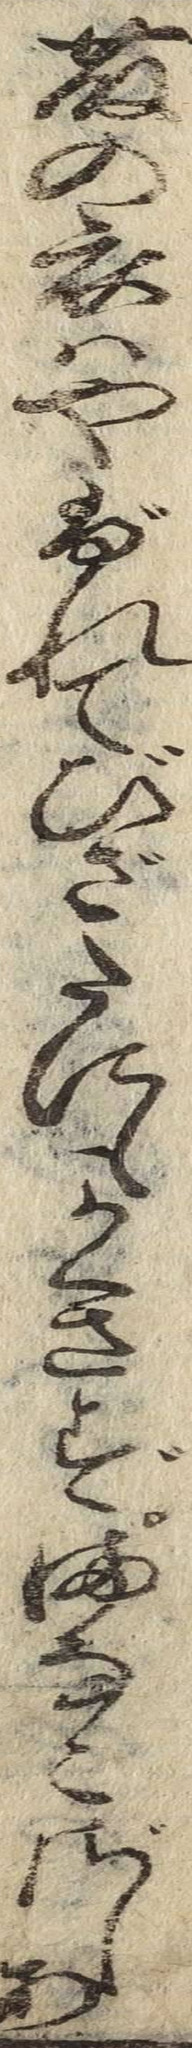藤の衣はやぶれて。ひざたにもかくさず。まんこさしあ
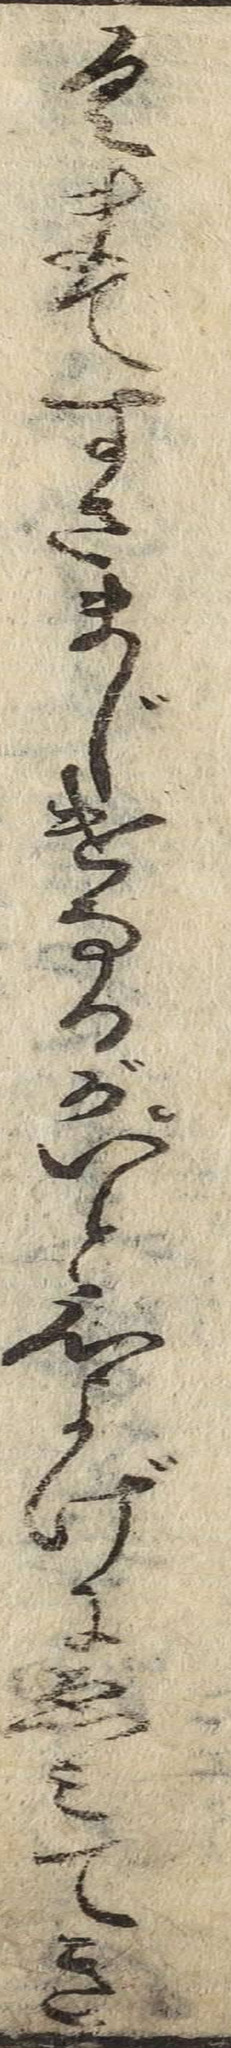くまですさまじけるかが。いとこゝろよげにゑみてき
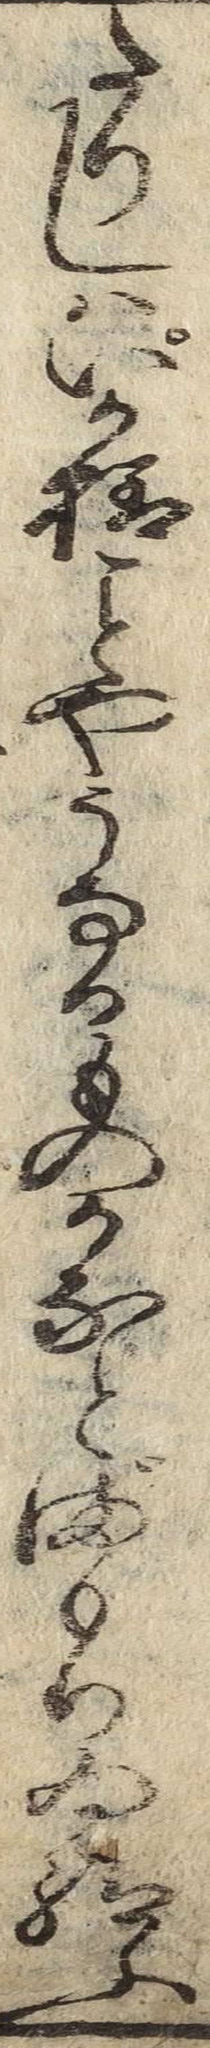たりしは。いか様ことやうるるものかなと。まもりゐ給ふ
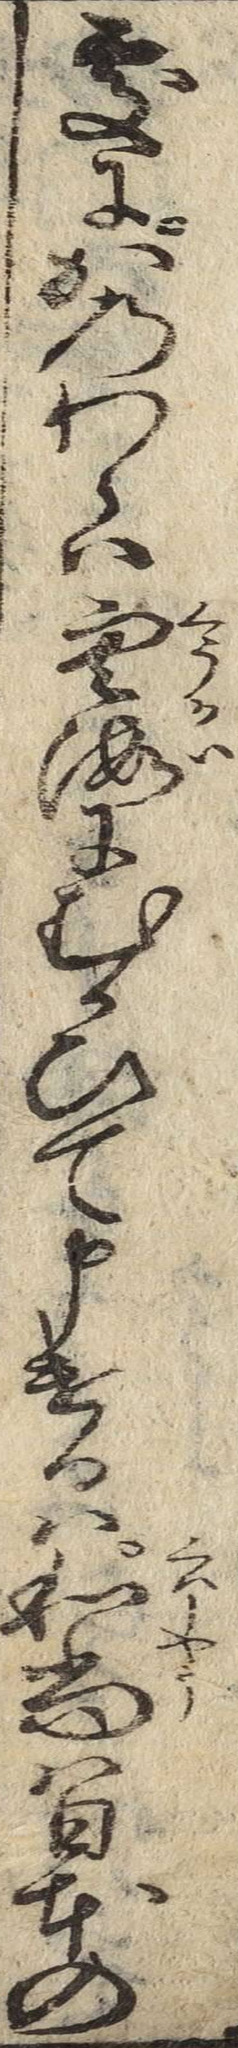更に。かのわらは空海にむかひて申けるは。和尚は日本の

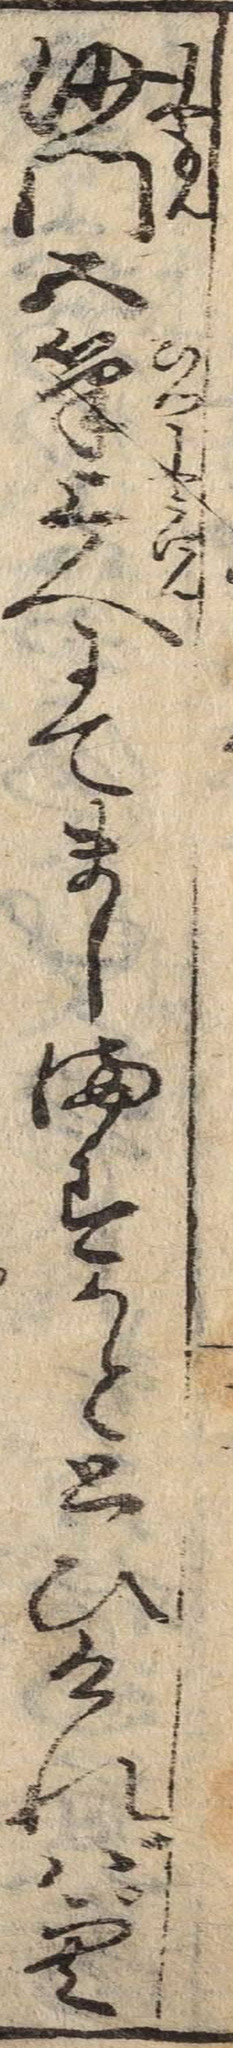沙門五筆上人にてましますかと思ひければ。空
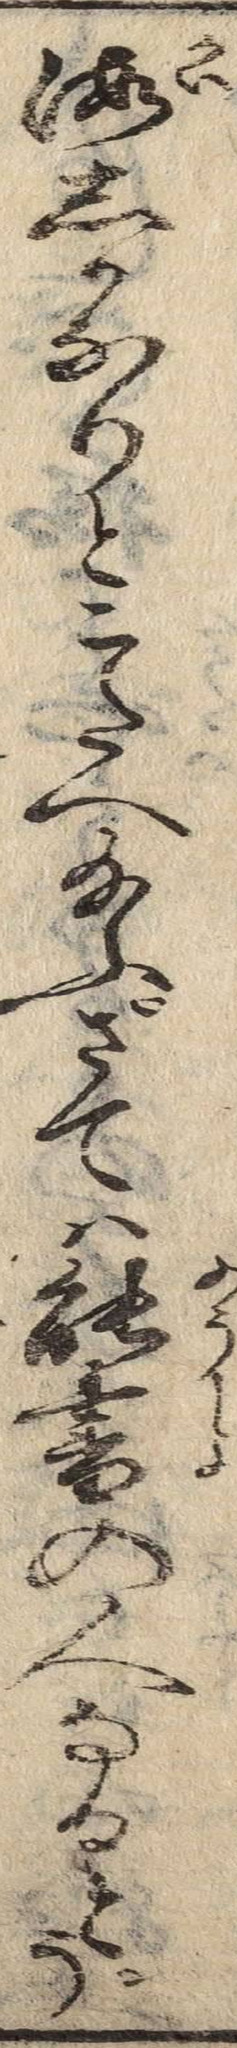海しかなりとこたへ給ふ。さては能書の人なると。う
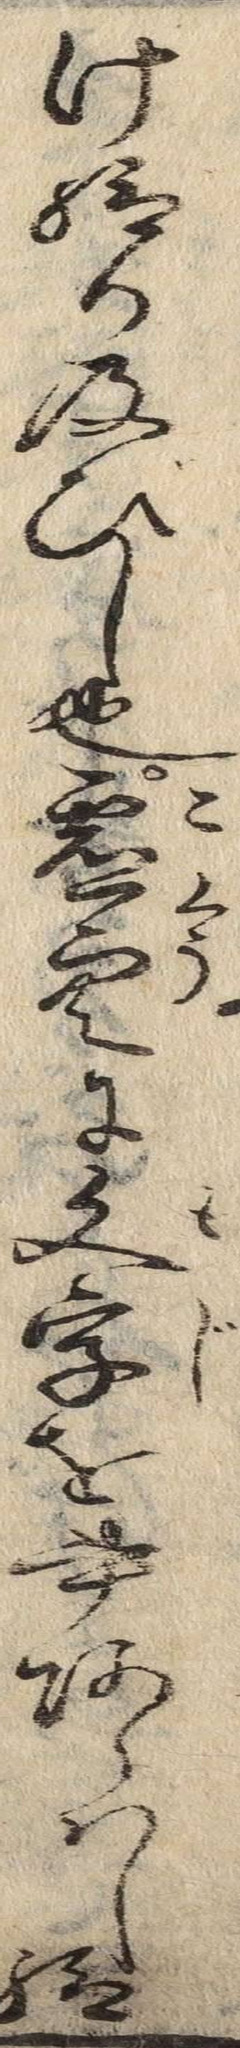け給り及びし也。虚空に文字を書あらはし給
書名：弘法大師御傳記
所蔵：京都府立京都学・歴彩館 国文学研究資料館
